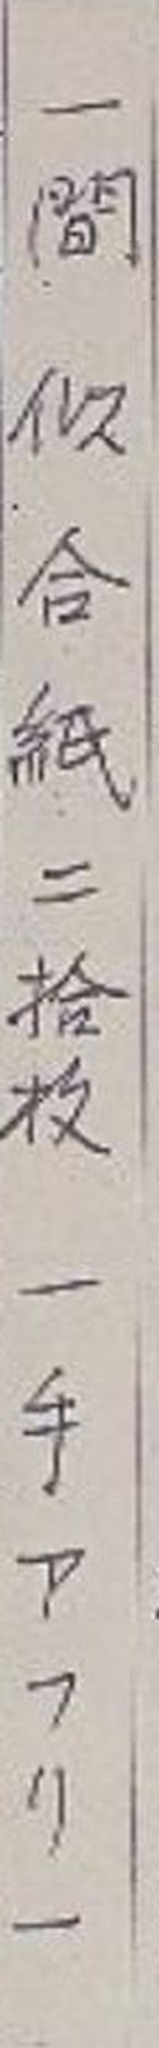一間似合紙二拾枚一手あふり一
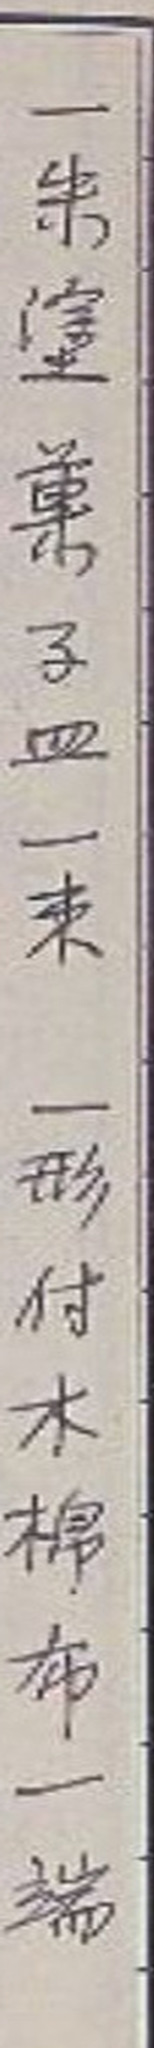一朱塗菓子皿一束一形付木棉布一端
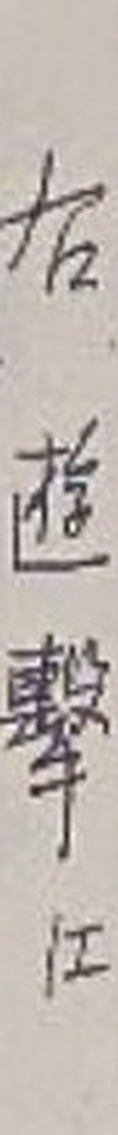右遊撃え
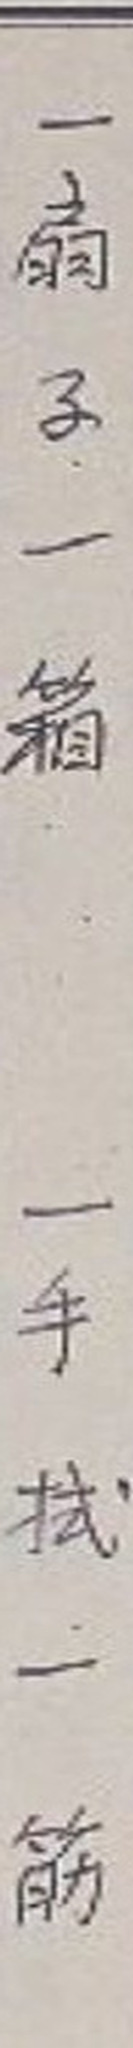一扇子一箱一手拭一筋
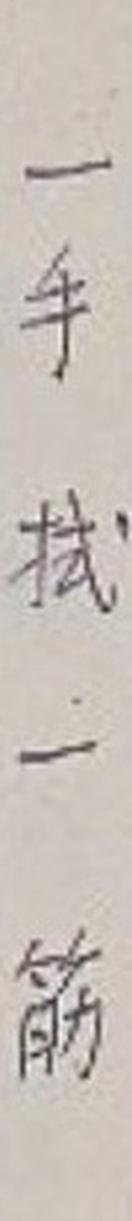一扇子一箱一手拭一筋
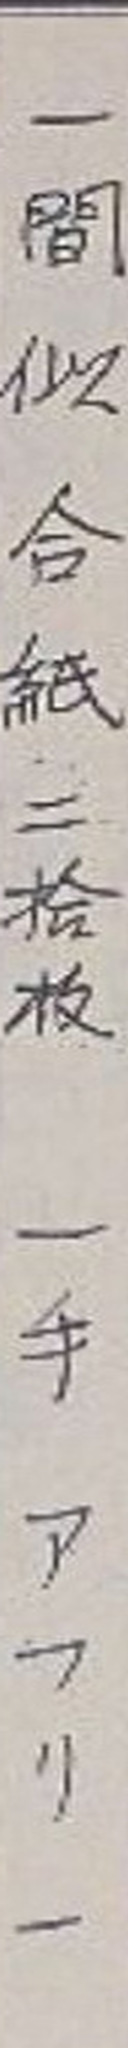一間似合紙二拾枚一手あふり一
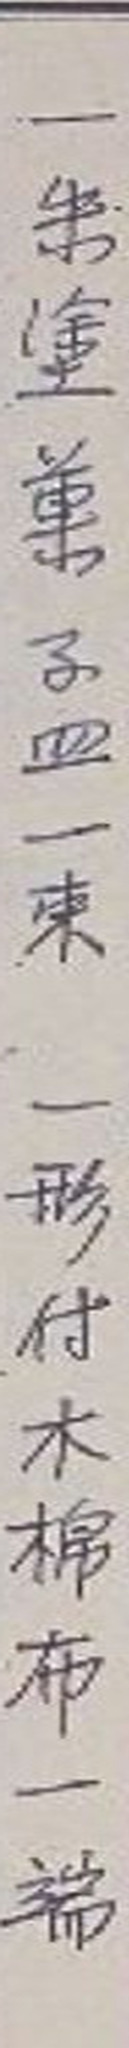一朱塗菓子皿一束一形付木棉布一端
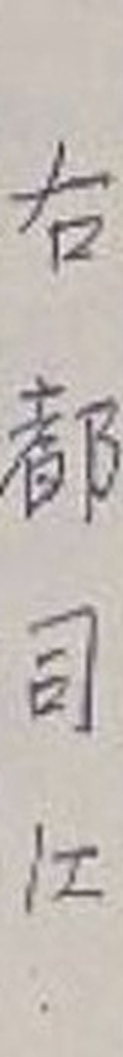右都司え
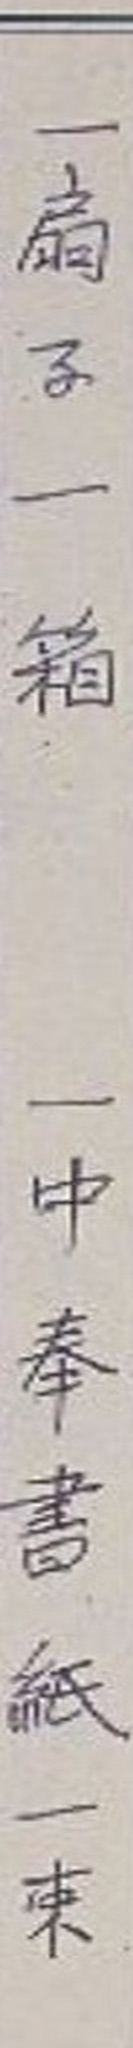一扇子一箱一中奉書紙一束
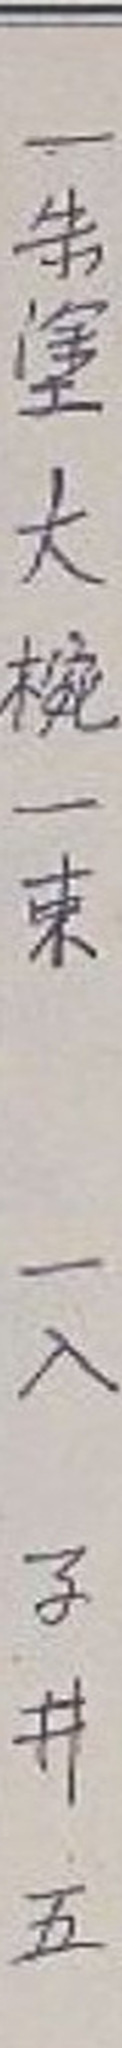一朱塗大椀一束一入子井五
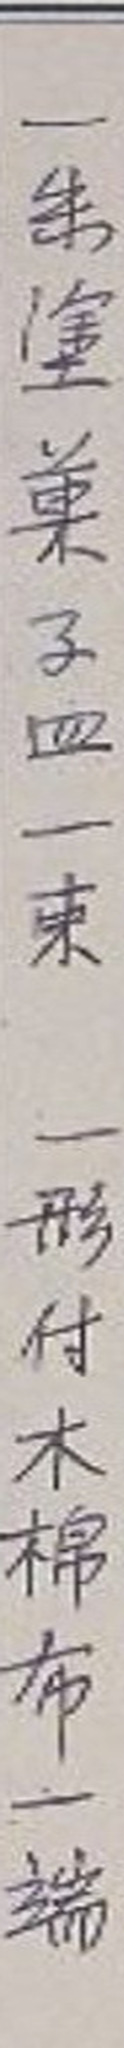一朱塗菓子皿一束一形付木棉布一端
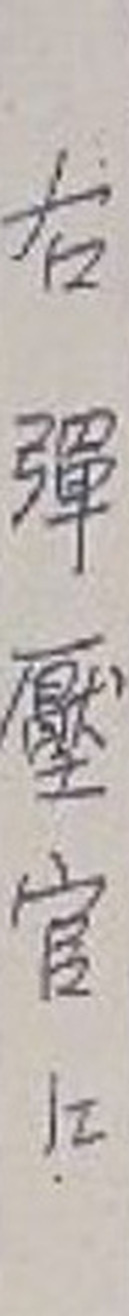右弾圧官え
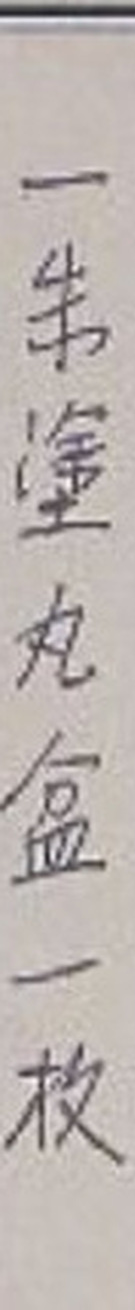一朱塗丸盆一枚
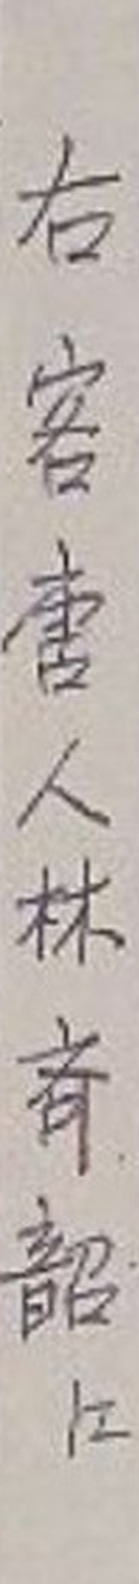右客唐人林斉韶え

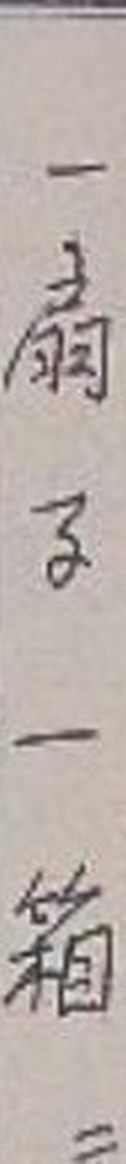一扇子一箱一手拭一筋
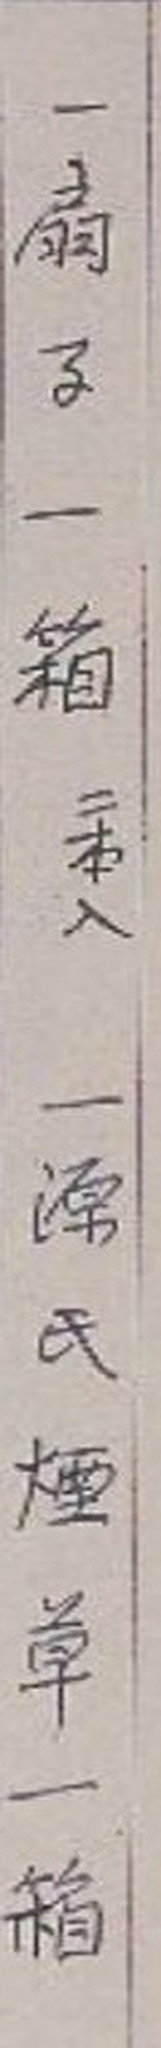一扇子一箱二本入一源氏煙草一箱
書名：支那冊封使来琉諸記 下巻
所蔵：University of the Ryukyus Library
